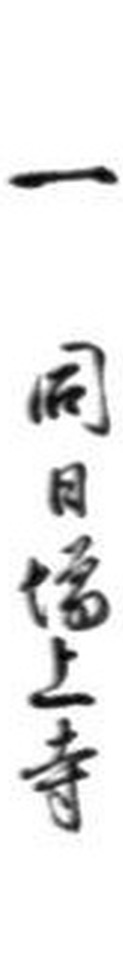一同日増上寺
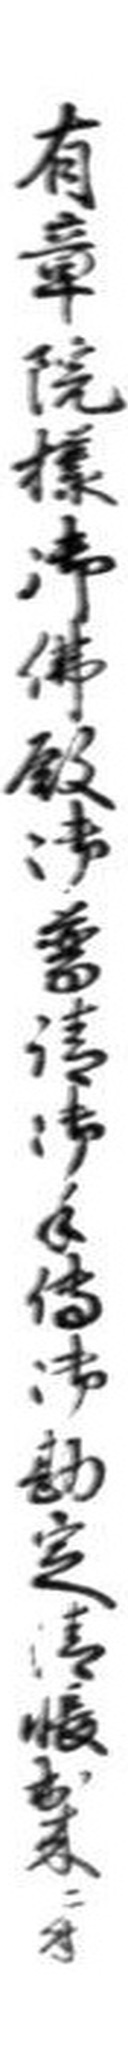有章院様御仏殿御御普請御手伝御勘定請帳出来ニ付
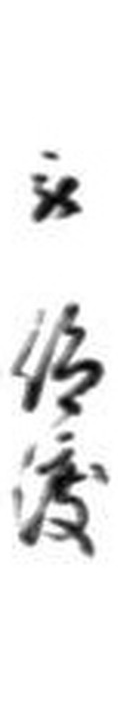被仰渡
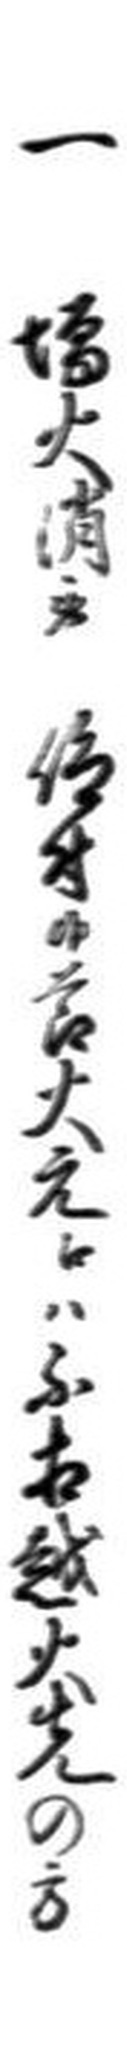一増火消被仰付候節火元江ハ不相越火先の方
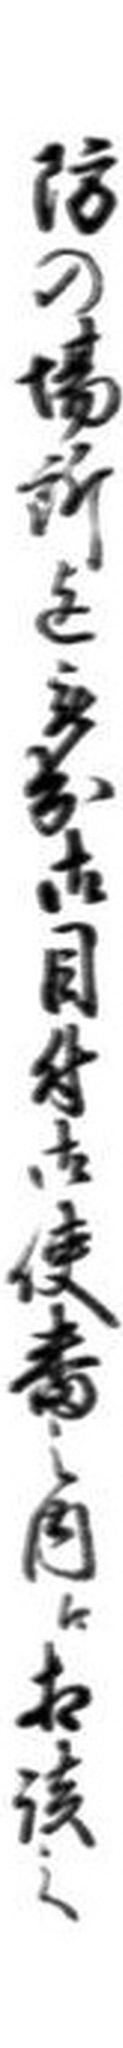防の場所迄被出御目付御使番之内江相談之
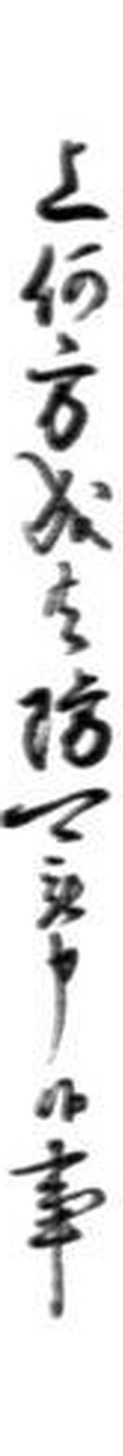上何方成共防可被申候事

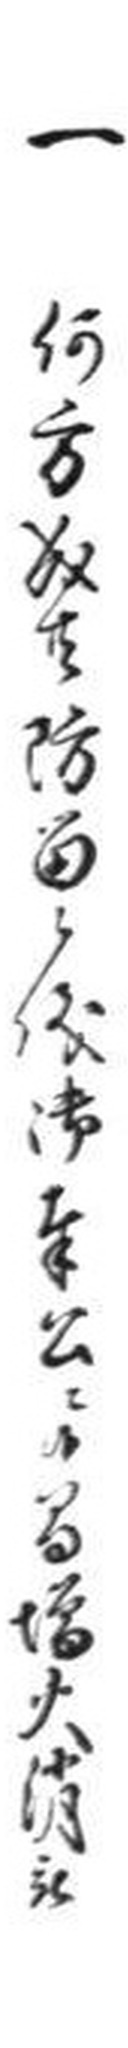一何方成共防留候儀御奉公ニ候間増火消被
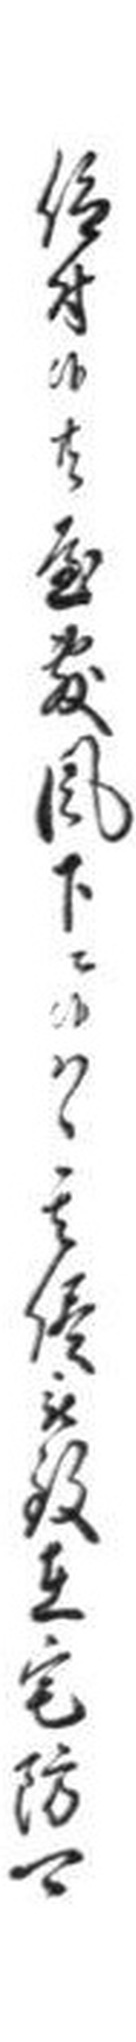仰付候共屋敷風下ニ候ハヽ其儘被致在宅防可
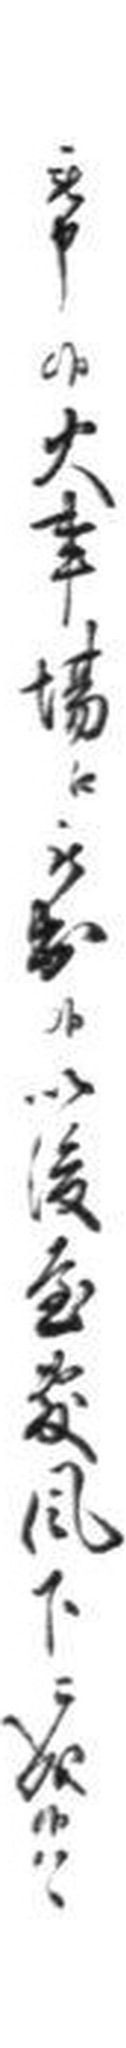被申候火事場江被出候以後屋敷風下ニ成候ハヽ
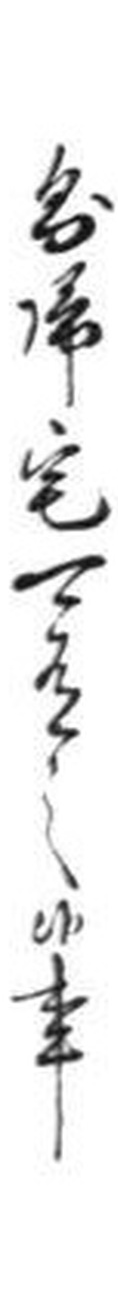則帰宅可有之候事
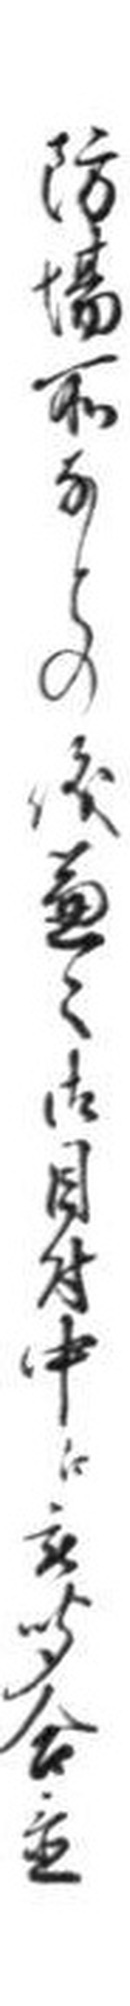防場所なとの儀兼々御目付中江被聞合置
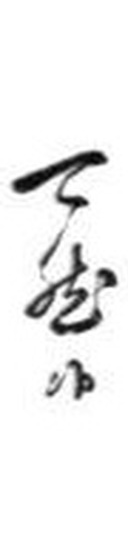可然候
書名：家譜 三十二 吉邦公 従享保二年到享保三年
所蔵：福井県文書館 Fukui Prefectural Archives
